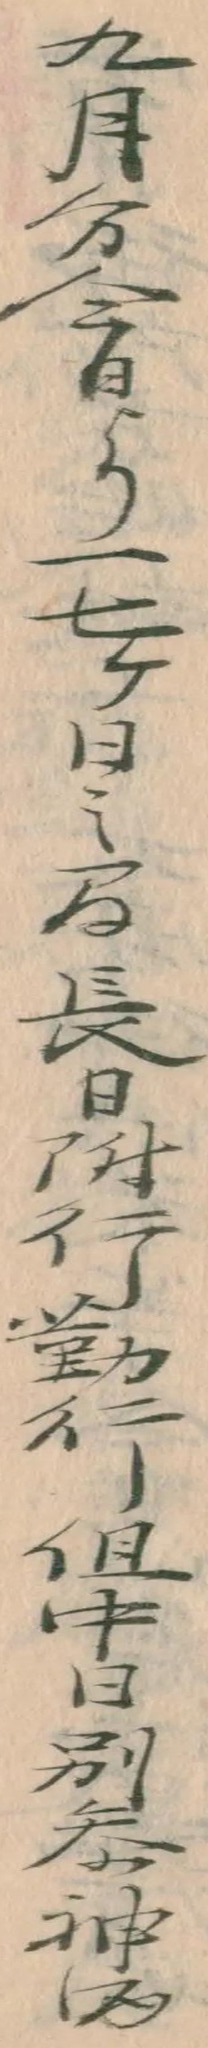九月分今日より一七ヶ日之間長日附行勤行但中日別参神酒
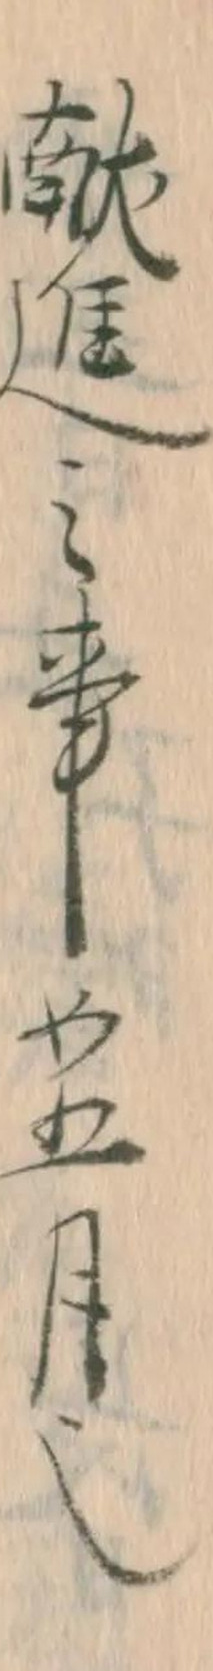献進之事如五月也
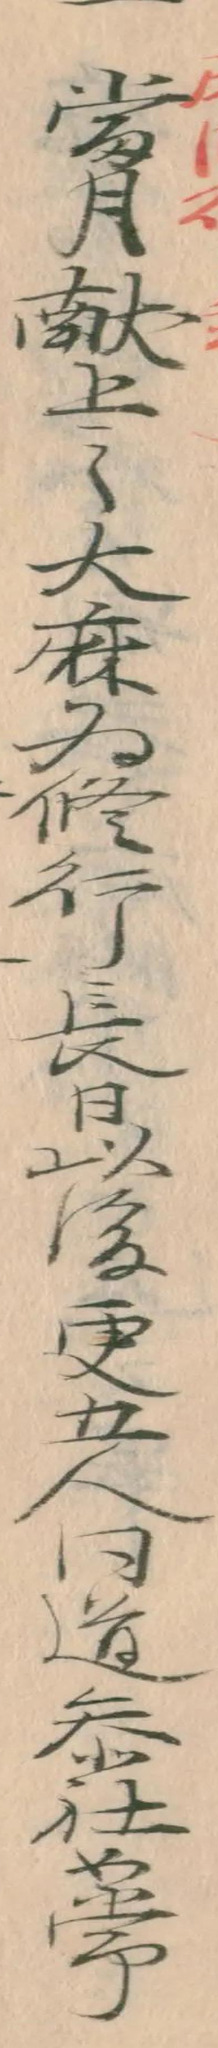一當月献上之大麻為修行長日以後更五人同道参社如常
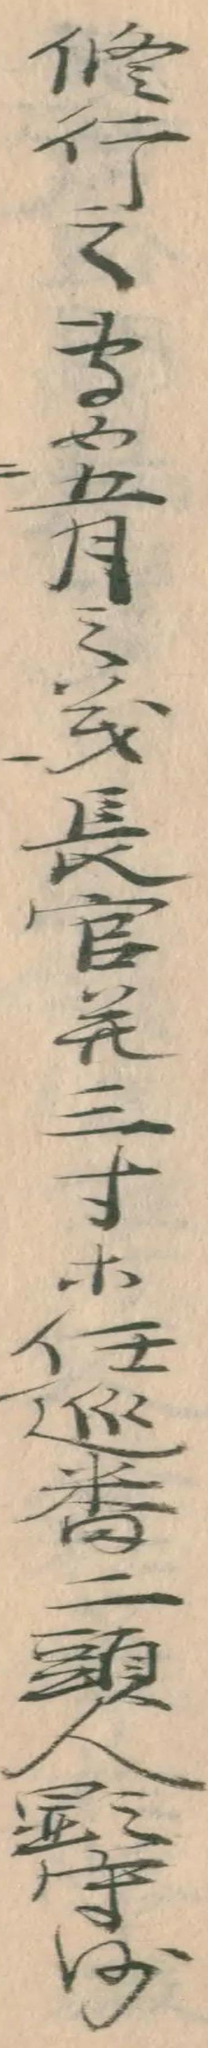修行之専五月之義長官并三寸等任巡番二頭人顕守沙
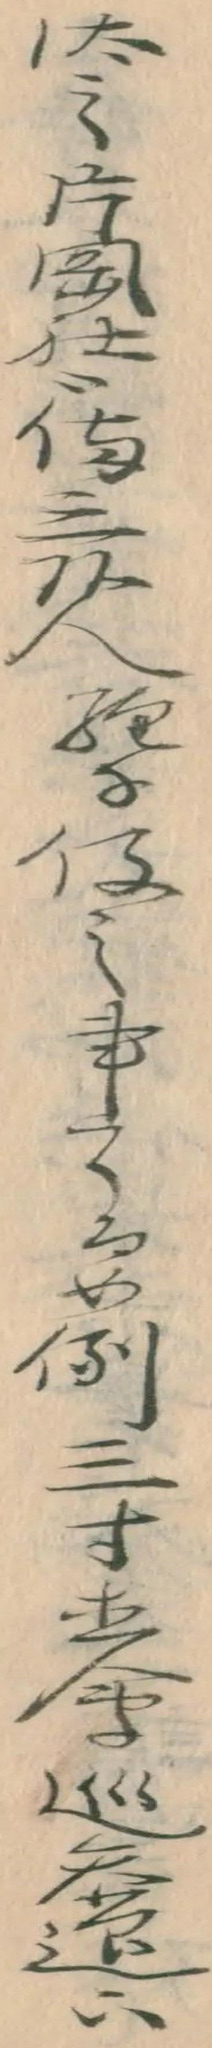汰之片岡社御備三頭人経千役之事了而如例三寸直會巡参退下

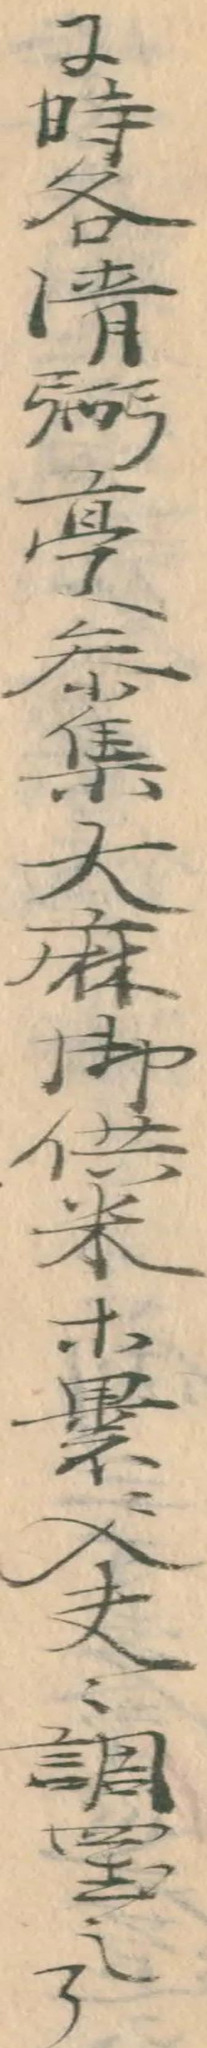于時各清弼亭へ参集大麻御供米等褁ニ入夫々調置之了
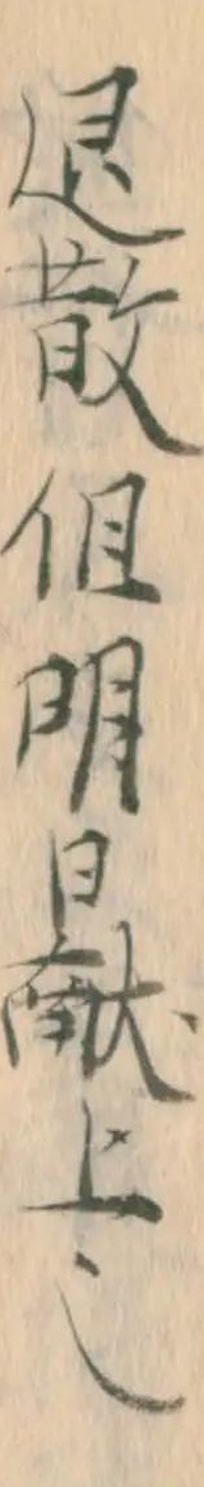退散但明日献上也
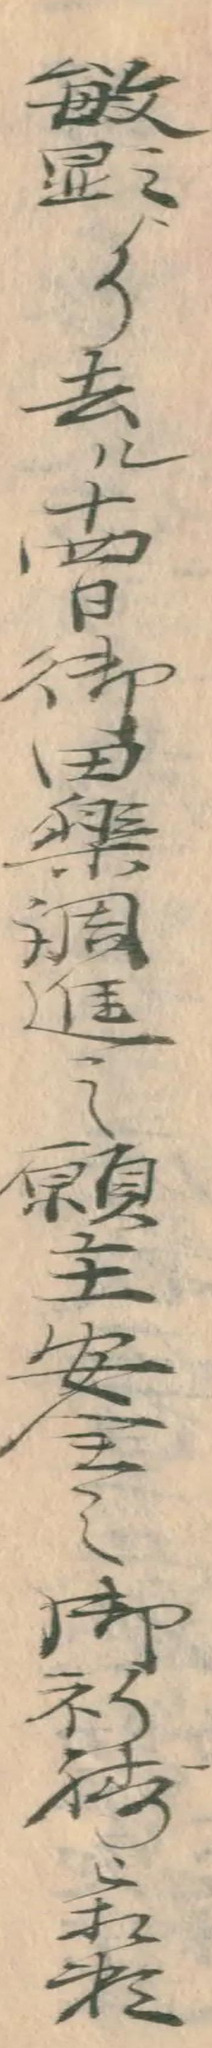一敏顕より去ル十四日御田楽調進之願主安全之御祈祷被相頼
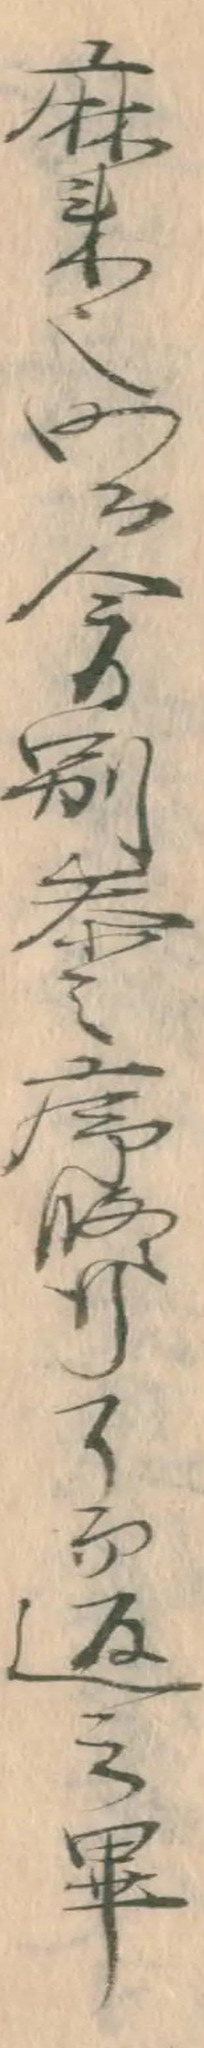麻来也仍而今日別参之序修行了而返之畢
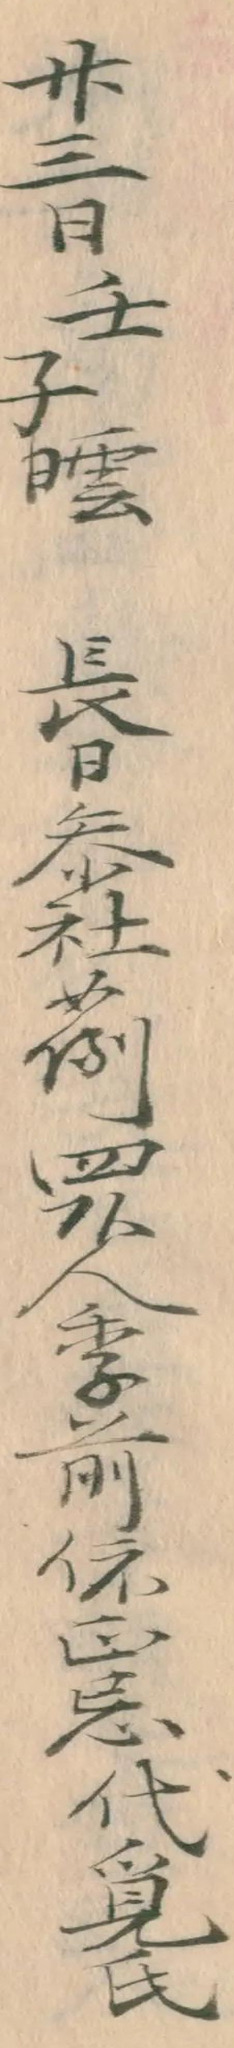廿三日壬子曇長日参社如例四頭人季前抔正忌代覓氏
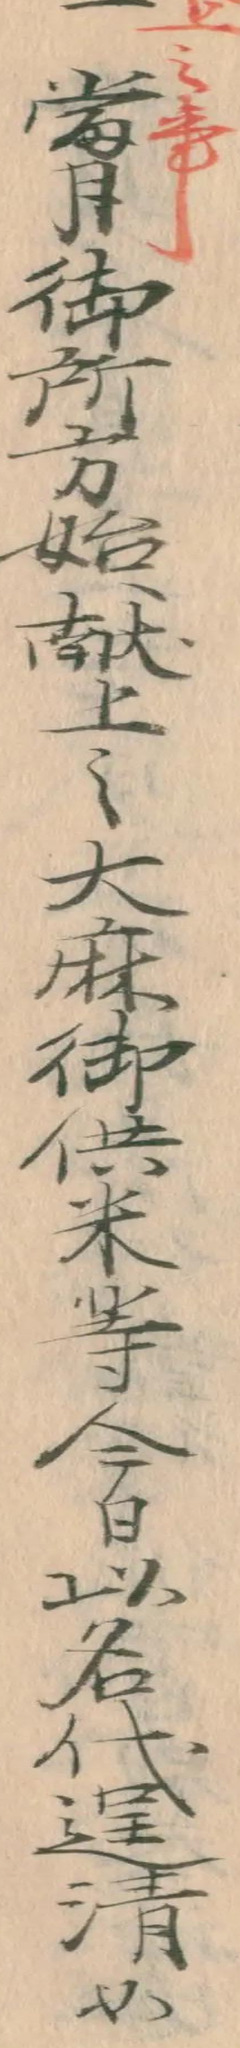一當月御所方始献上之大麻御供米等今日以名代逞清如
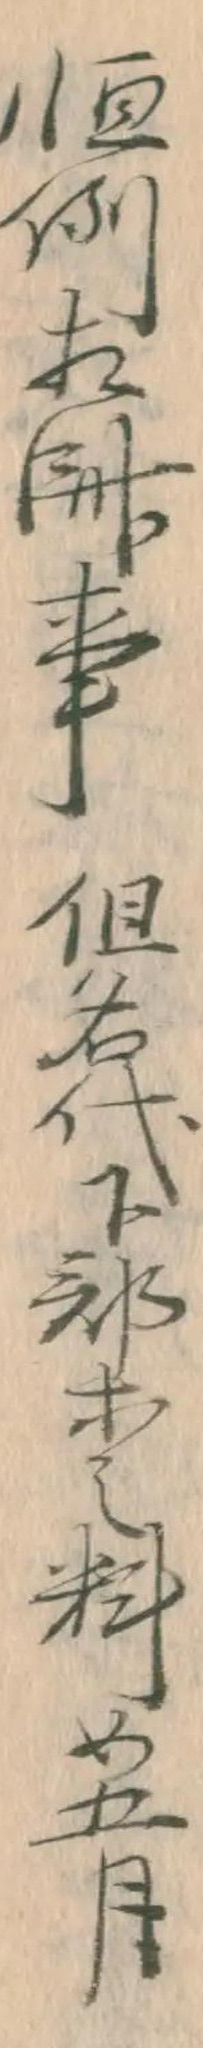恒例相済事但名代下部等之料如五月
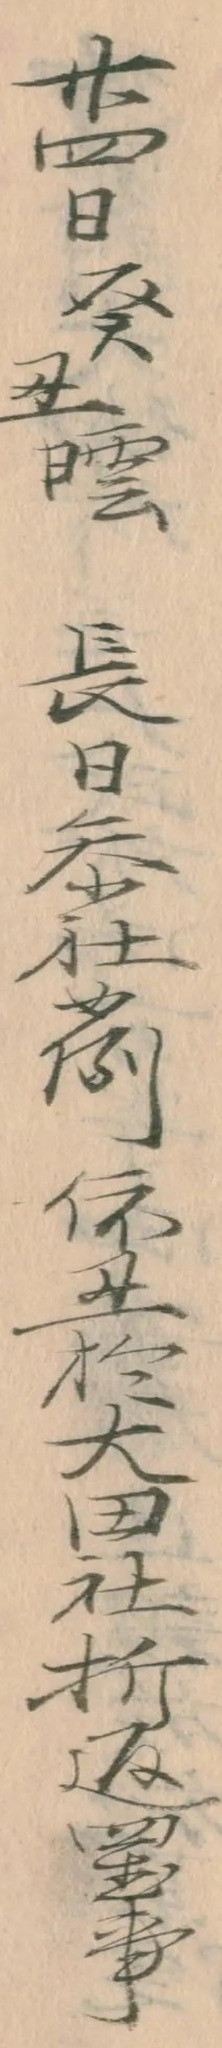廿四日癸丑曇長日参社如例依丑於大田社折返置事
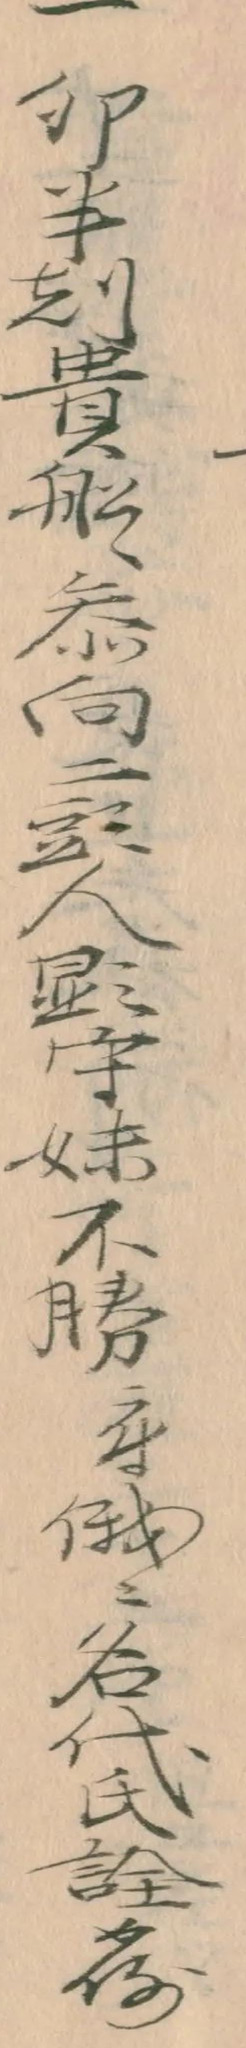一卯半刻貴舩へ参向二頭人顕守妹不勝ニ付俄に名代氏詮如例
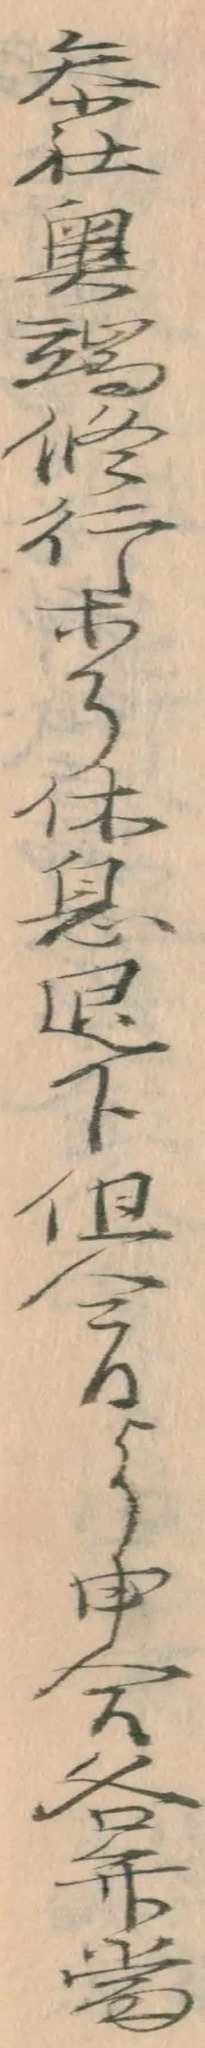参社奥端修行等了休息退下但今日より申合各弁當
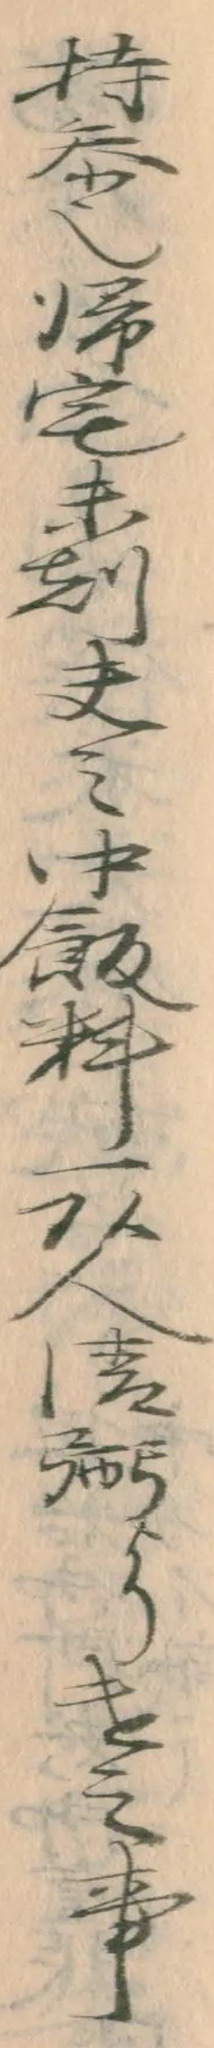持参也帰宅未刻夫々中飯料一頭人清弼より遣之事
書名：賀茂社記録. 第74冊
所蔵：国立国会図書館 National Diet Library, JAPAN
